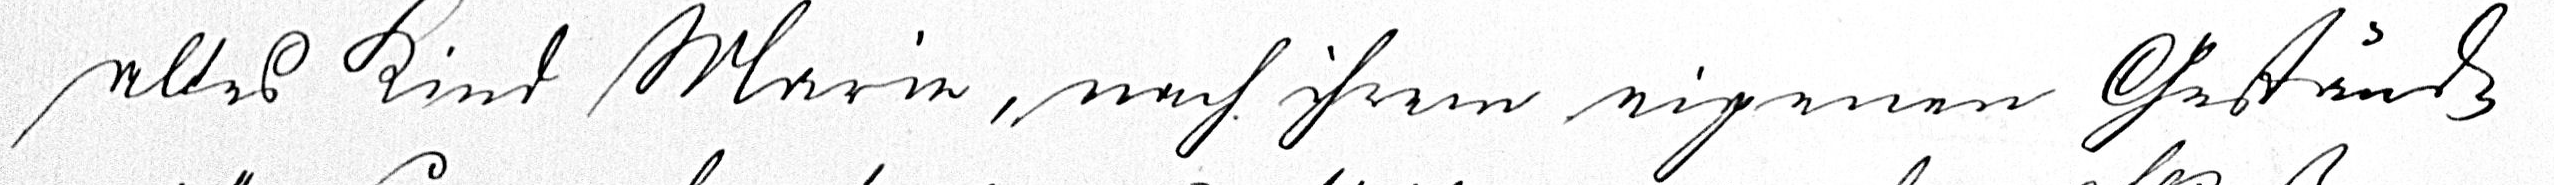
altes Kind Marie, nach ihrem eigenen Gestände¬
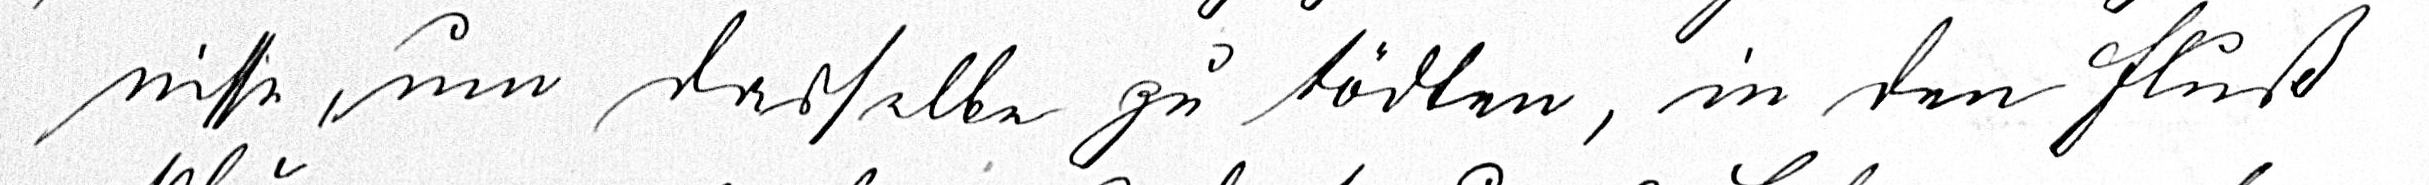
nisse, um dasselbe zu tödten, in den Fluß
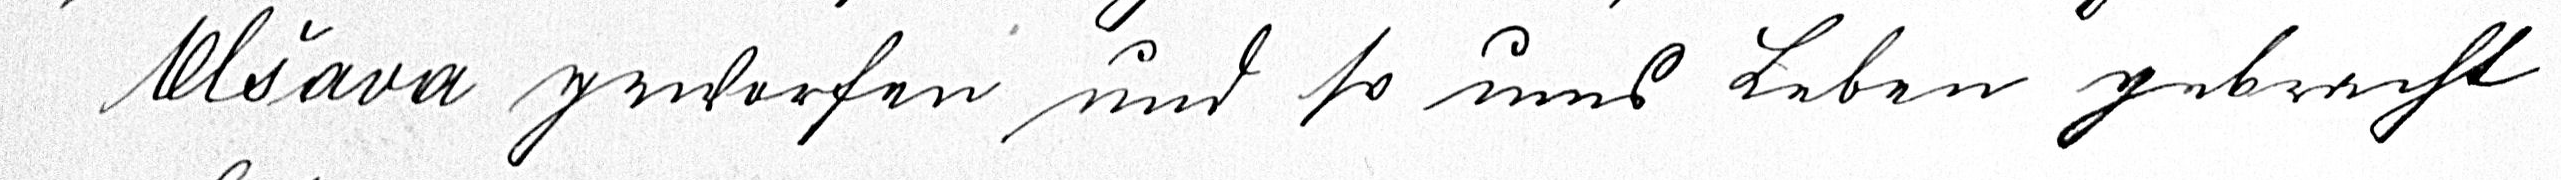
Olšava geworfen und so ums Leben gebracht
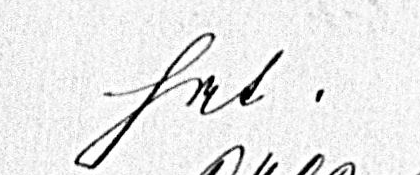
hat.
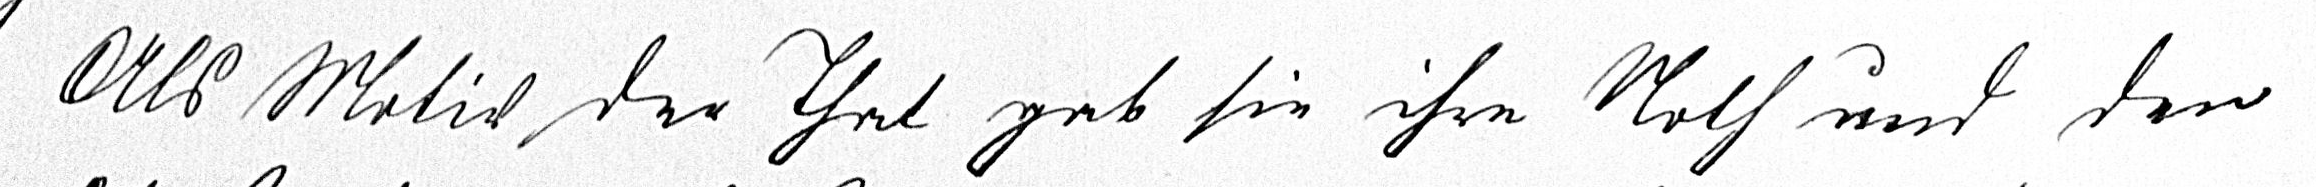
Als Motiv der That gab sie ihre Noth und den
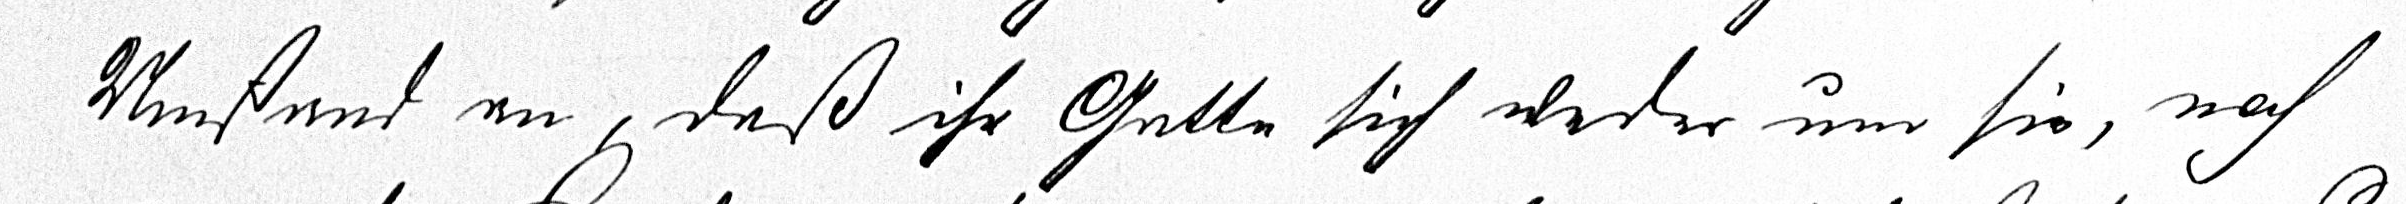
Umstand an, daß ihr Gatte sich weder um sie, nach
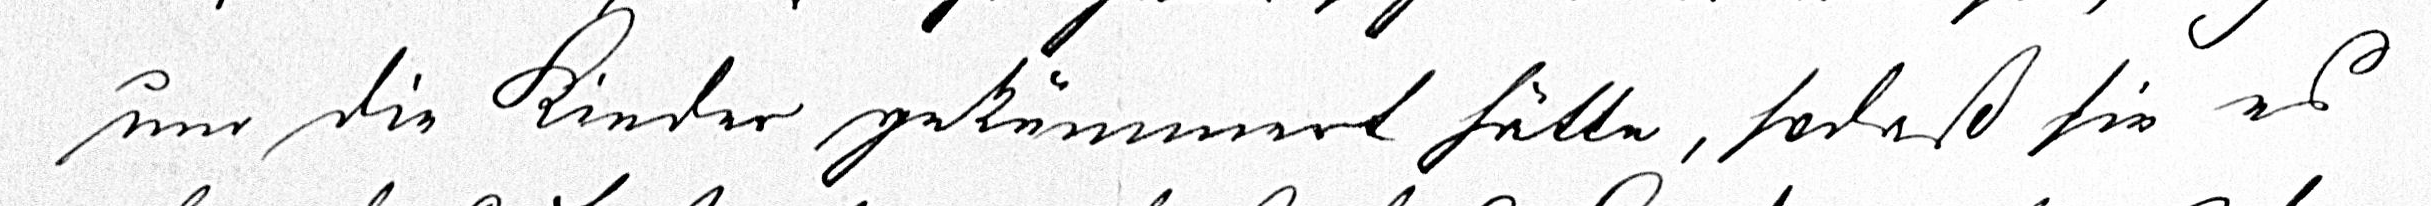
um die Kinder gekümmert hätte, sodaß sie es
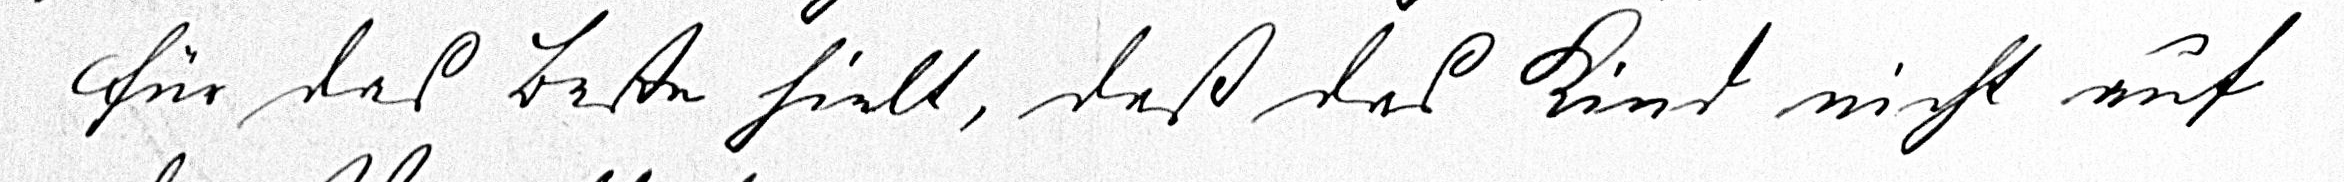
für das Beste hielt, daß das Kind nicht auf
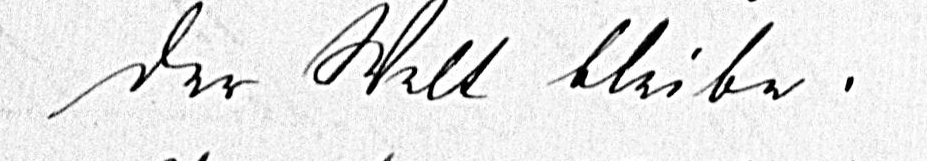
der Welt bleibe.
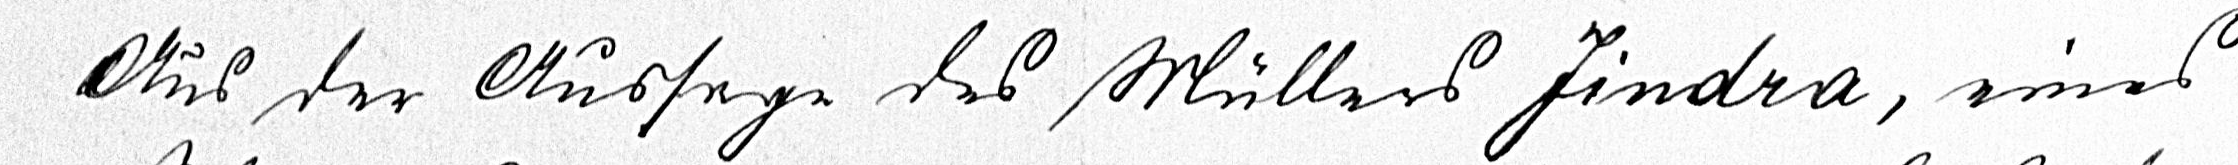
Aus der Aussage des Müllers Jindra, eines
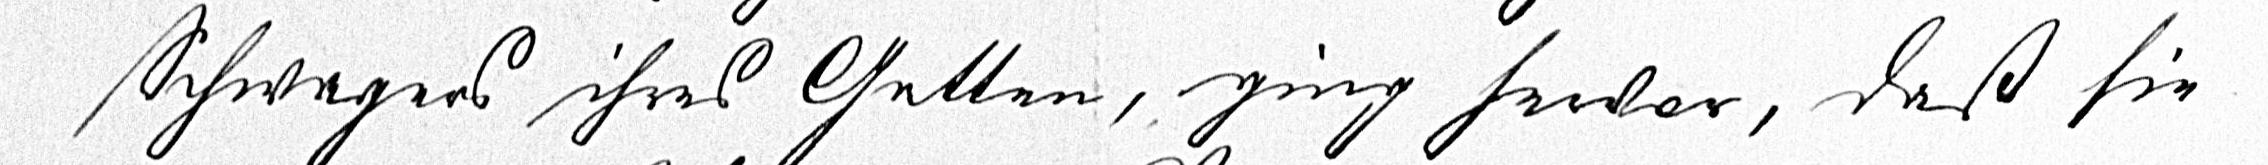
Schwagers ihres Gatten, ging hervor, daß sie
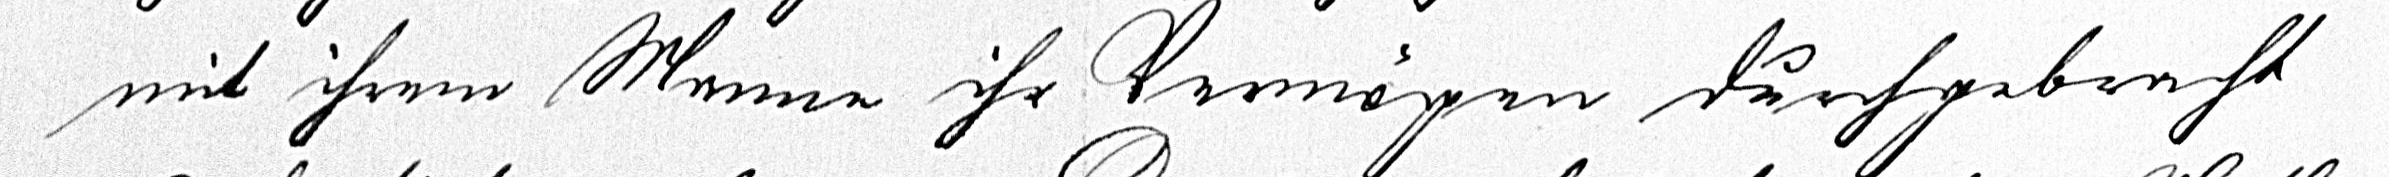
mit ihrem Manne ihr Vermögen durchgebracht
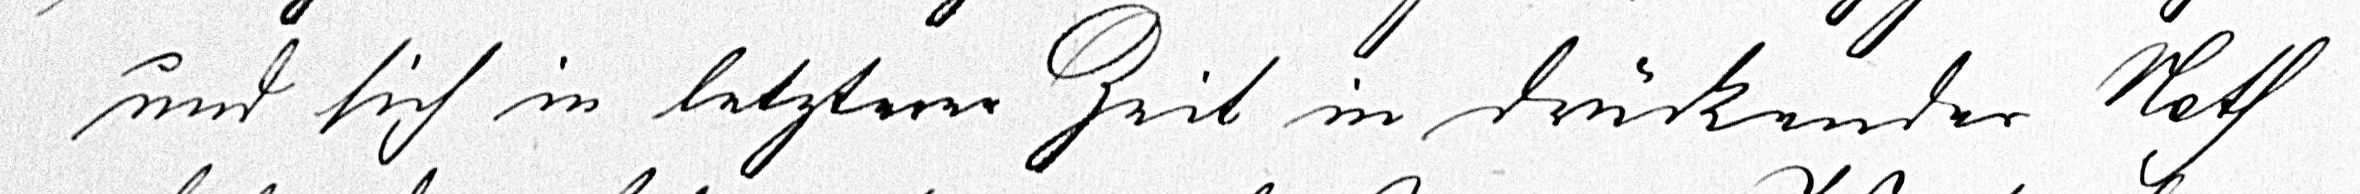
und sich in letzterer Zeit in drückender Noth
